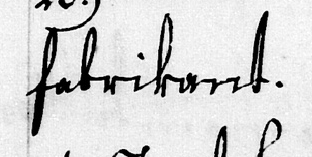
fabrikant.
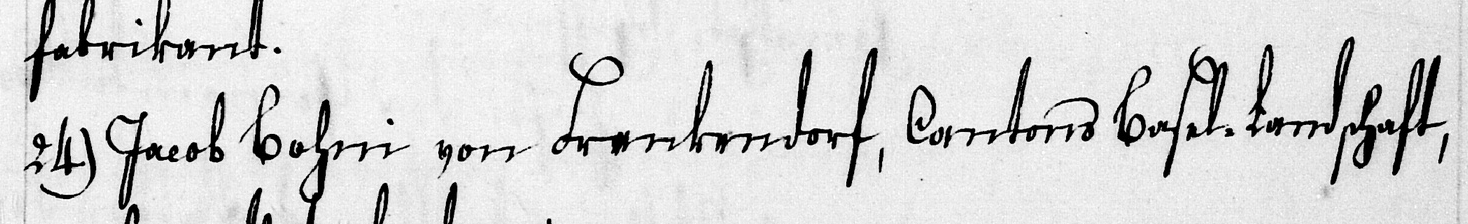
24.) Jacob Bohni von Frenkendorf, Cantons Basel-Landschaf¬
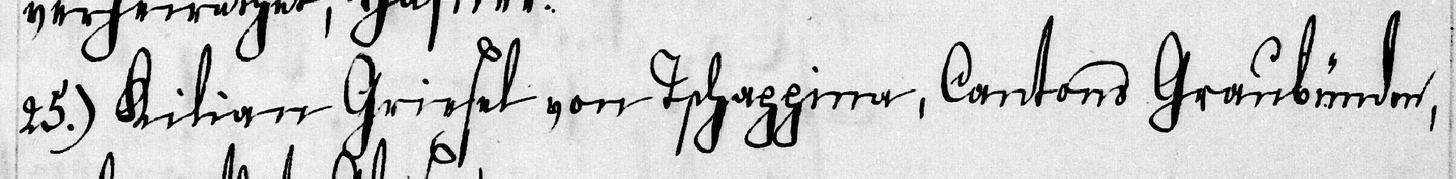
25.) Kilian Griesel von Tschappina, Cantons Graubünden,
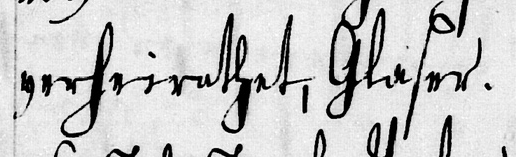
verheirathet, Glaser.
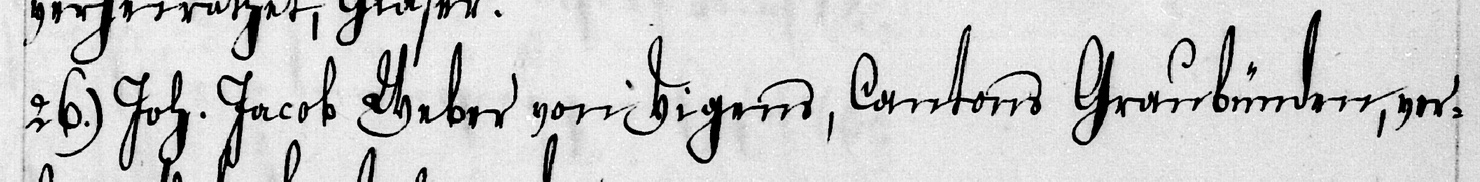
26.) Joh. Jacob Weber von Vigens, Cantons Graubünden, ver¬
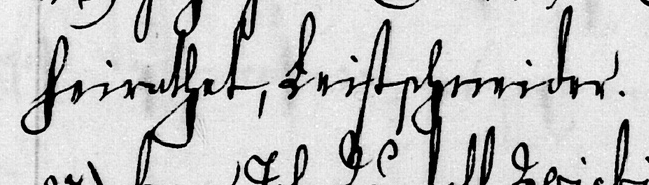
heirathet, Leistschneider.
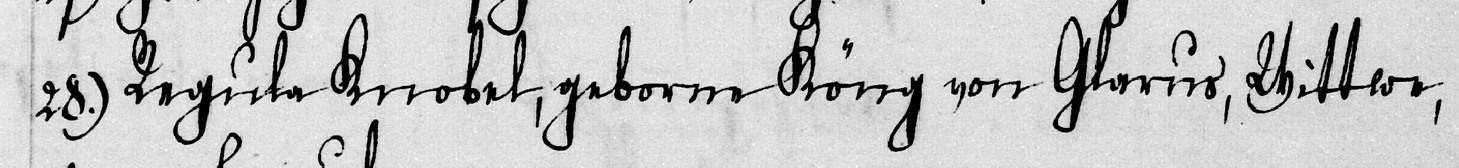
28.) Regula Knobel, geborne Köng von Glarus, Wittwe,
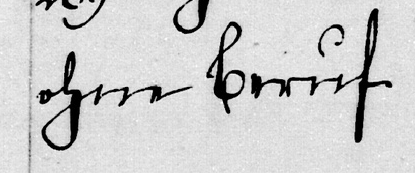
ohne Beruf.
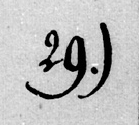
27.)
